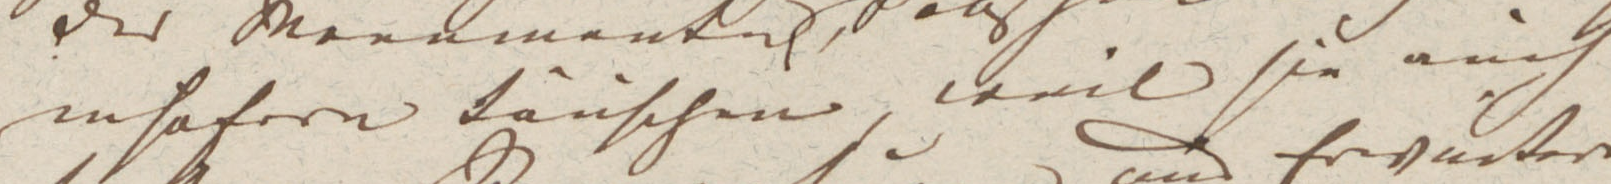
insofern täuschen, weil sie auch
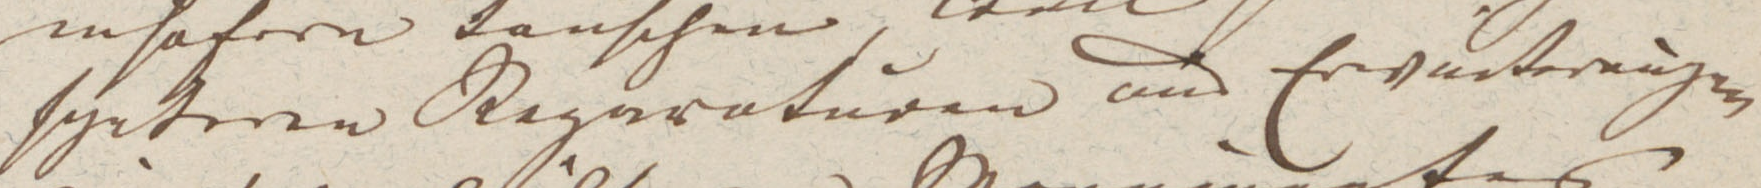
spateren Reparaturen und Erweiterungen
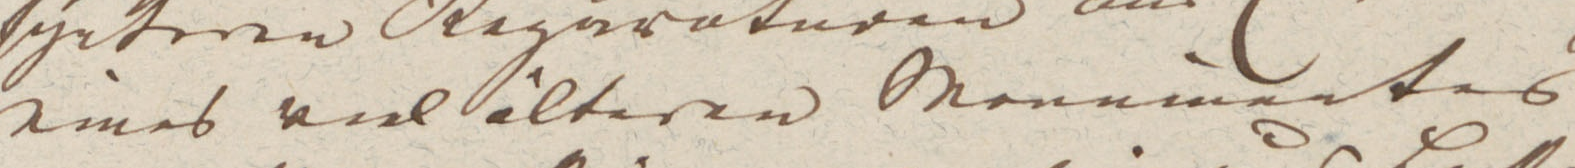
eines viel älteren Monumentes
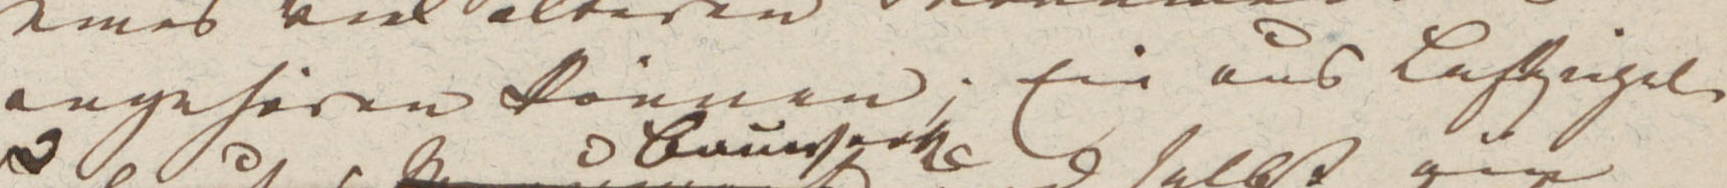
angehören können; Ein aus Luftziegeln
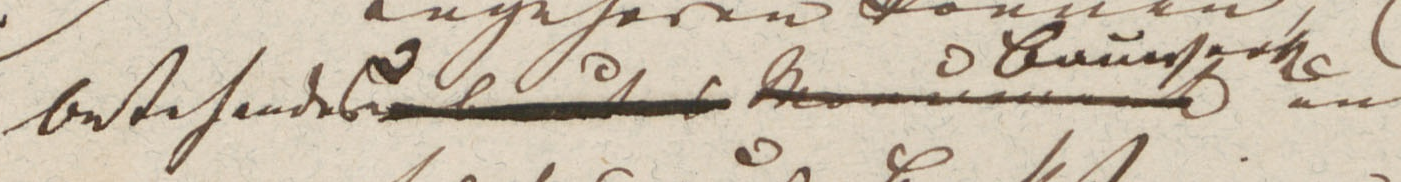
bestehendes Monument Bauwerk
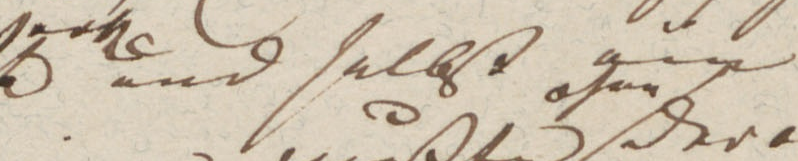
und selbst ein
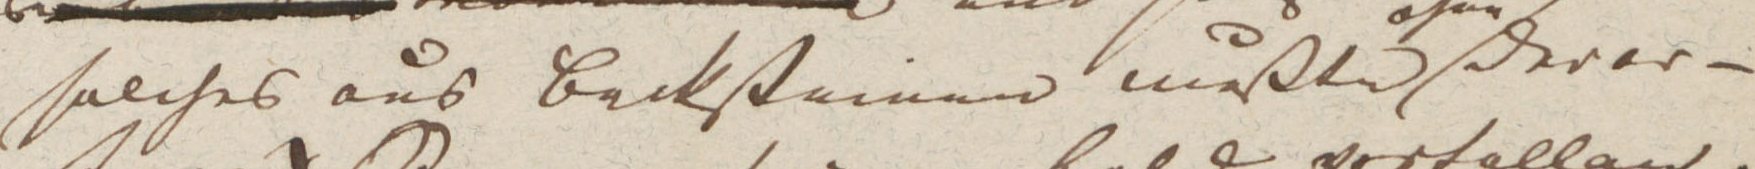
solches aus Backsteinen musste ohne derar-
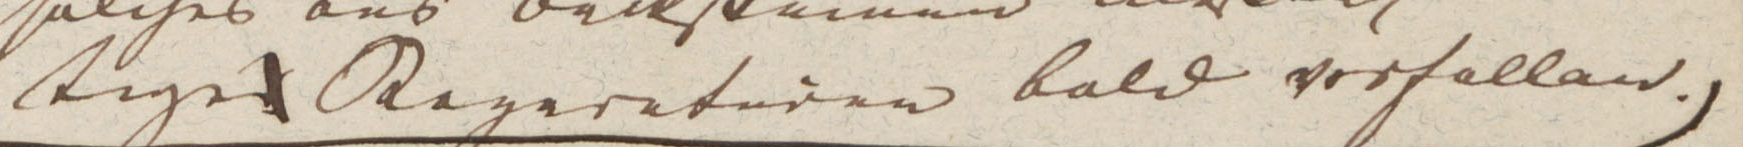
tiges Reparaturen bald verfallen. %
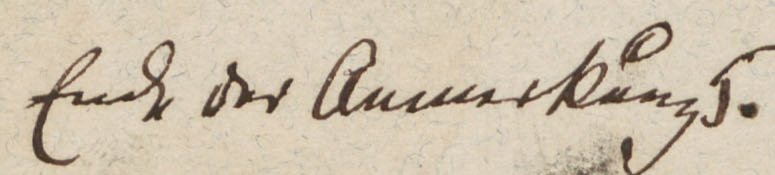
Ende der Anmerkung. %
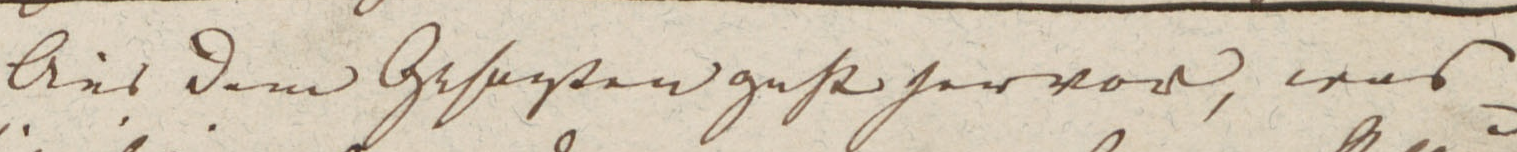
Aus dem Gesagten geht hervor, was
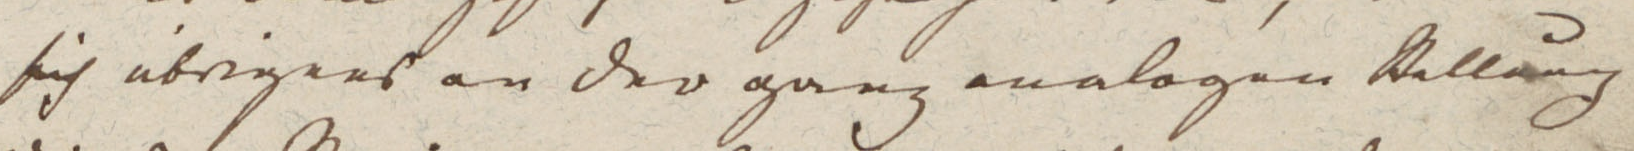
sich übrigens an der ganz analogen Stellung
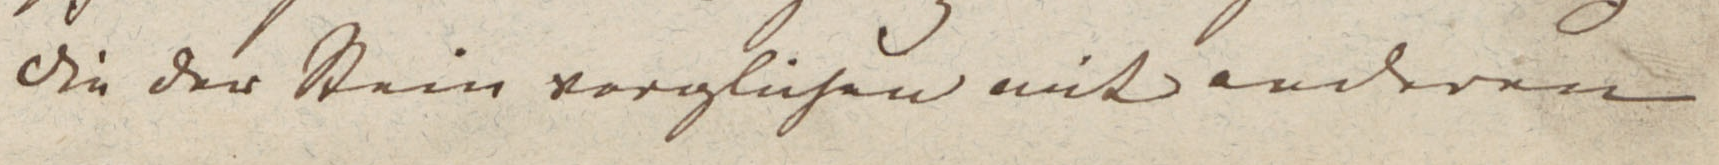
die der Stein verglichen mit anderen
